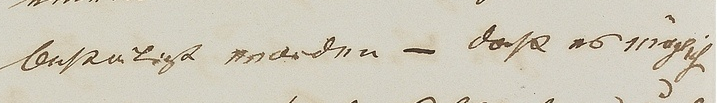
bestätigt worden – daß es möglich
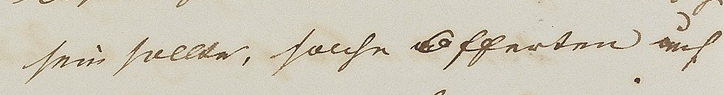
sein sollte, solche Offerten auf
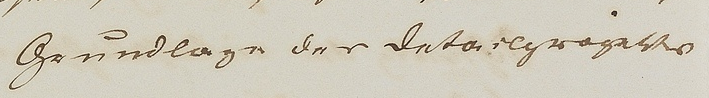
Grundlage des Detailprojektes
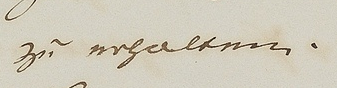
zu erhalten. –
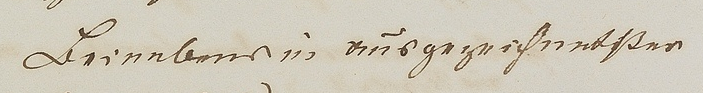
Beinebens in ausgezeichnetster
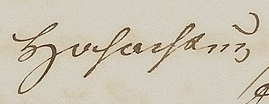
Hochachtung
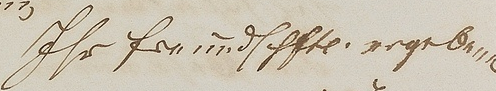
Ihr freundschftl. ergebener
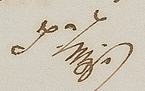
J. Zingg.
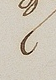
76.
